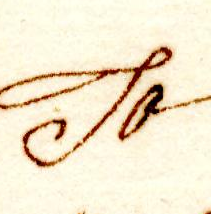To
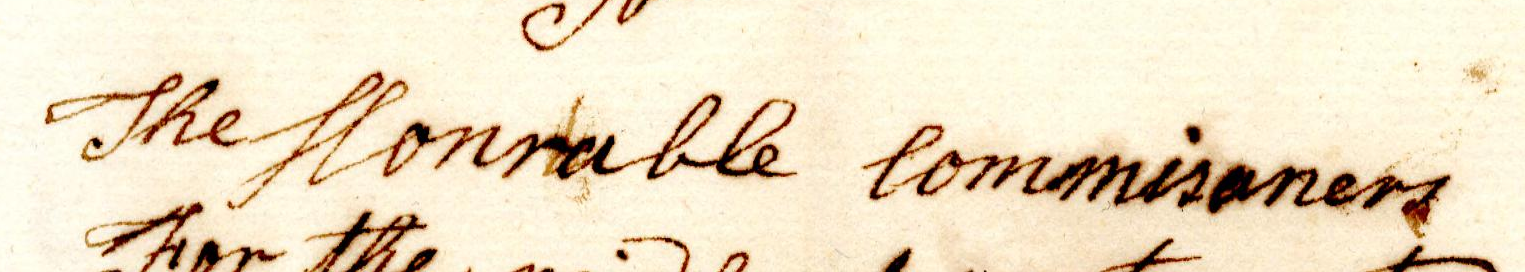The Honrable commisoners
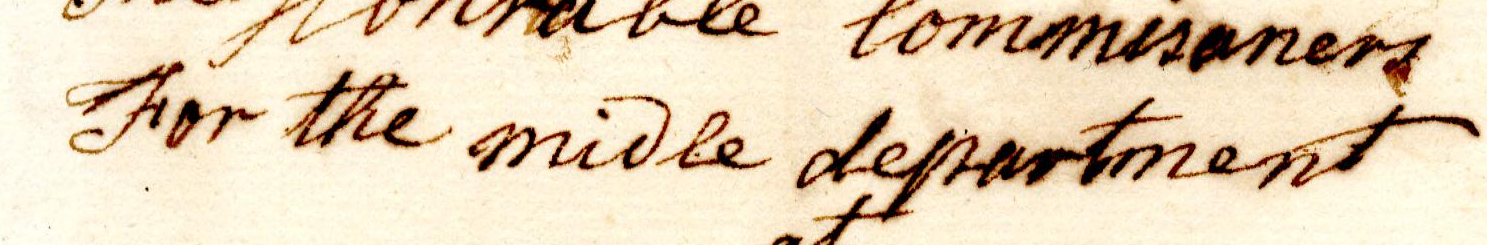For the midle department
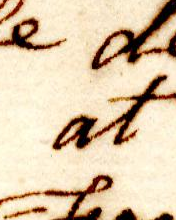at
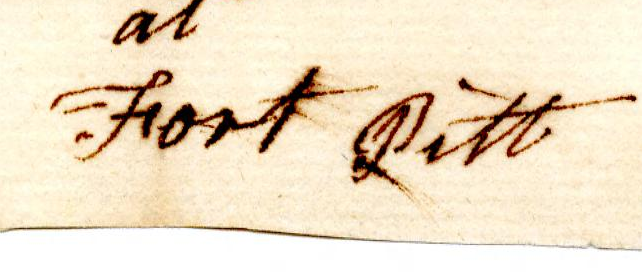Fort Pitt
